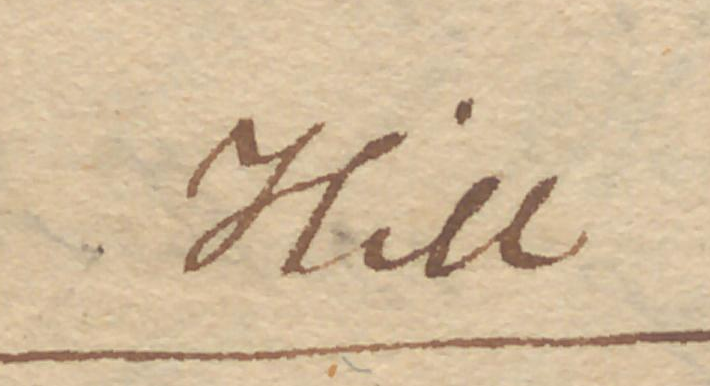Hill
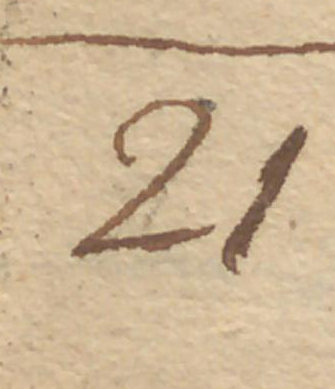21
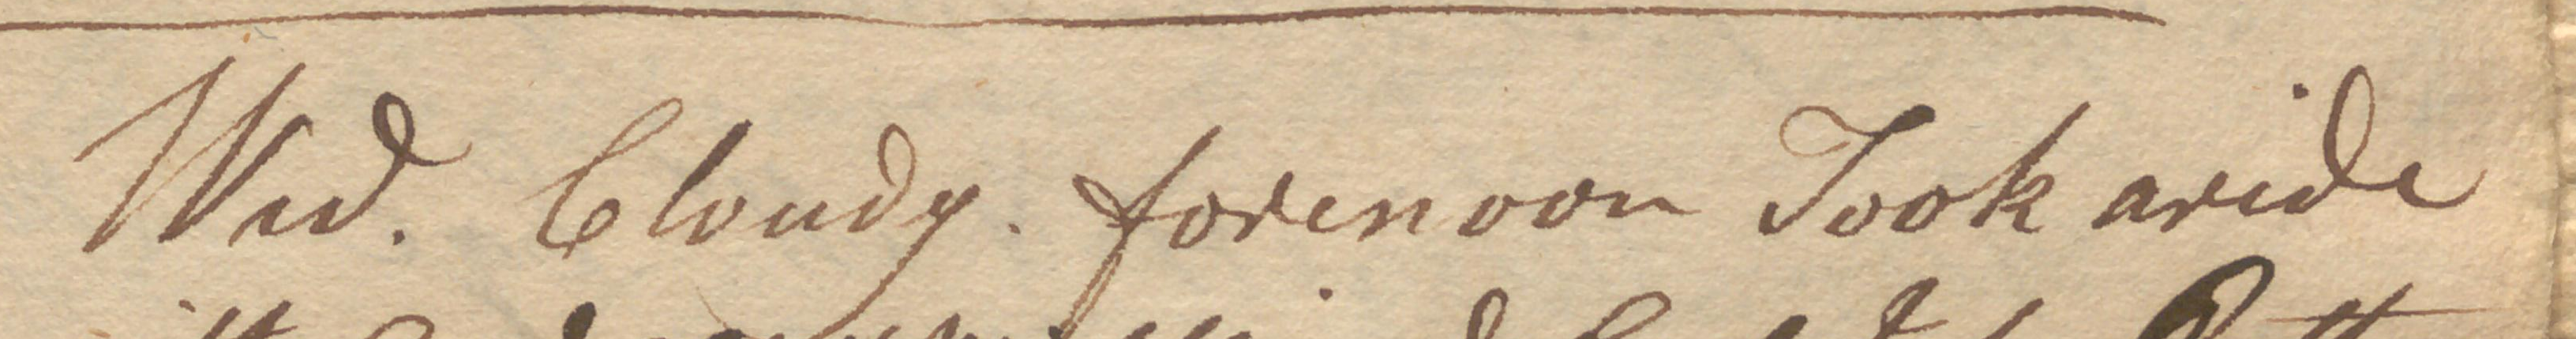Wed. Cloudy. forenoon Took a ride
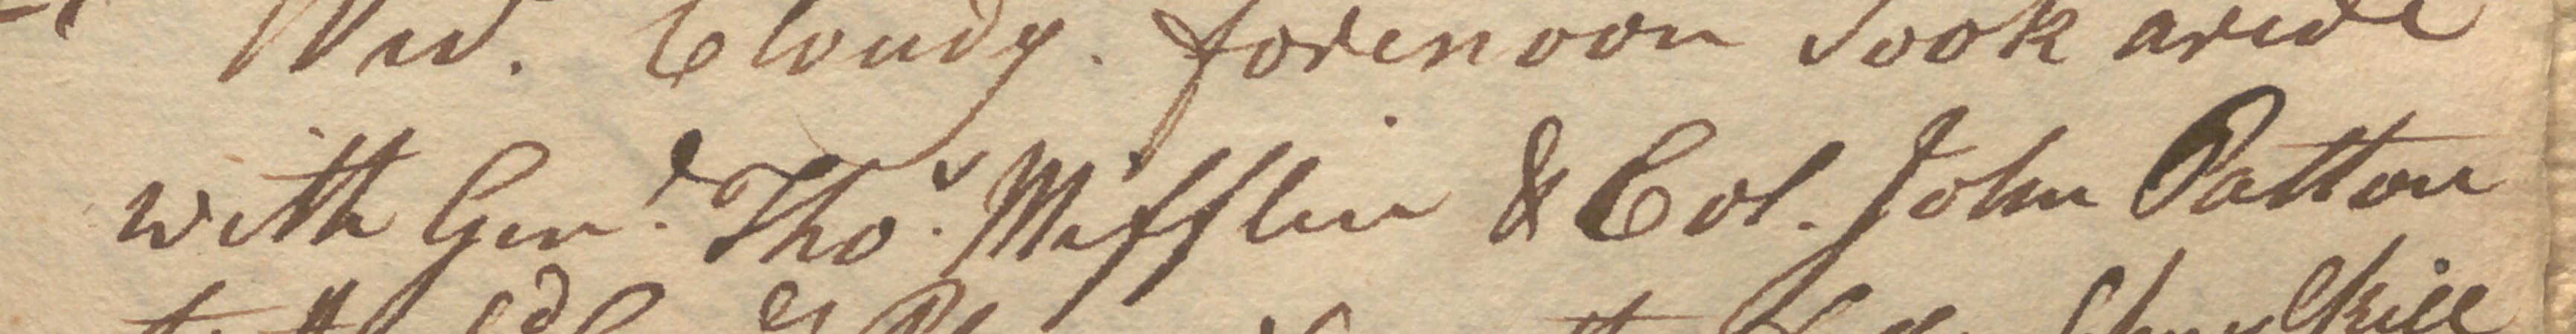with Gen^l. Tho^s. Mifflin & Col. John Patton
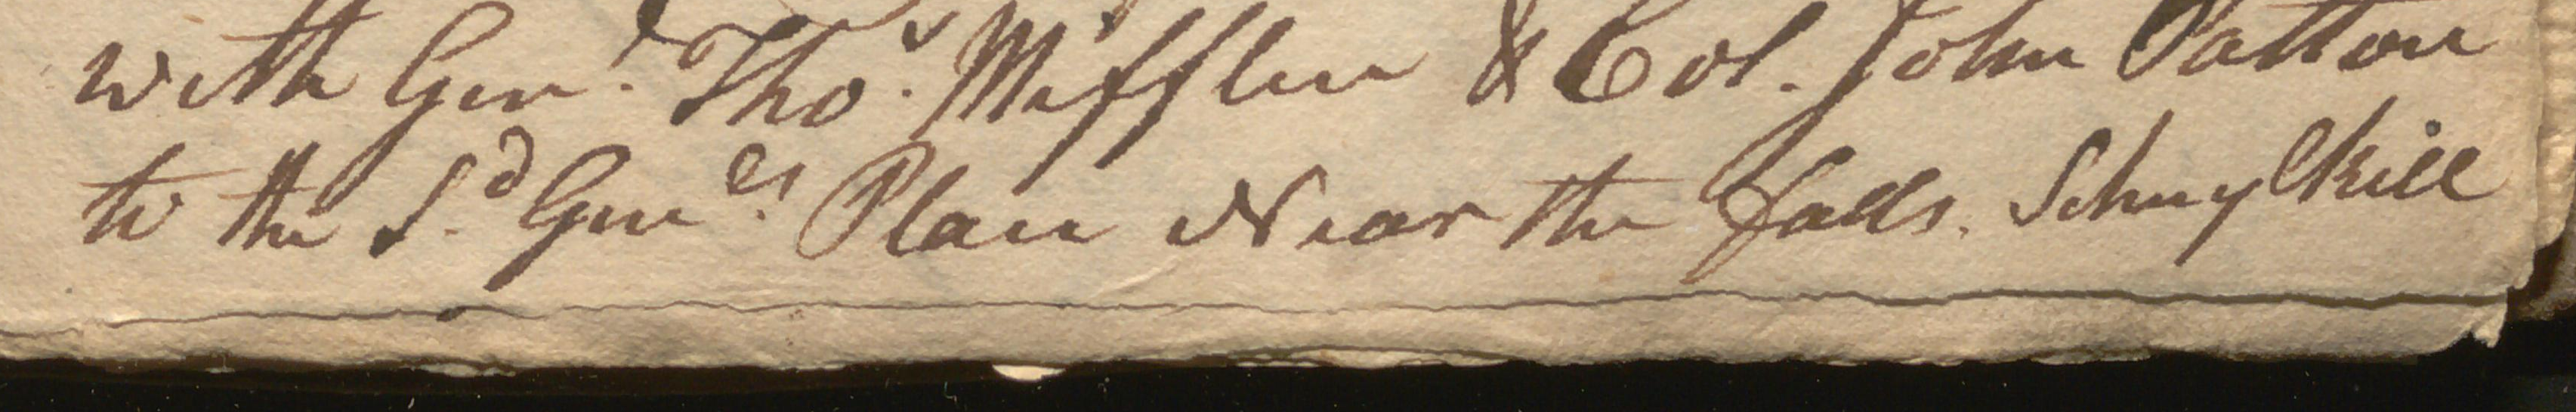to the s^d. Gen^ls. Plan Near the falls Schuylkill
